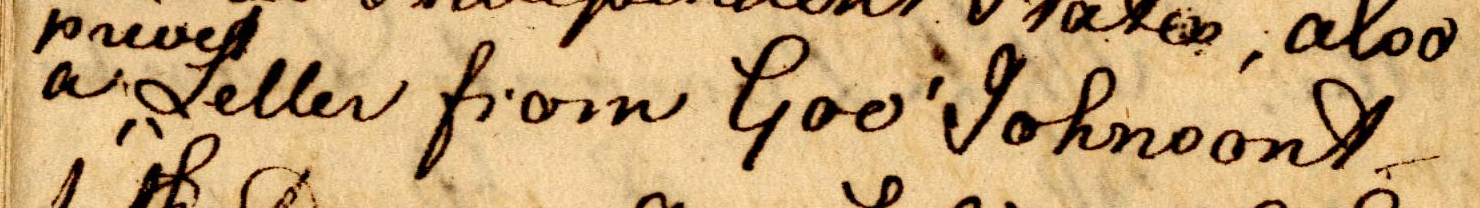a ^ Letter from Gov Johnsont-
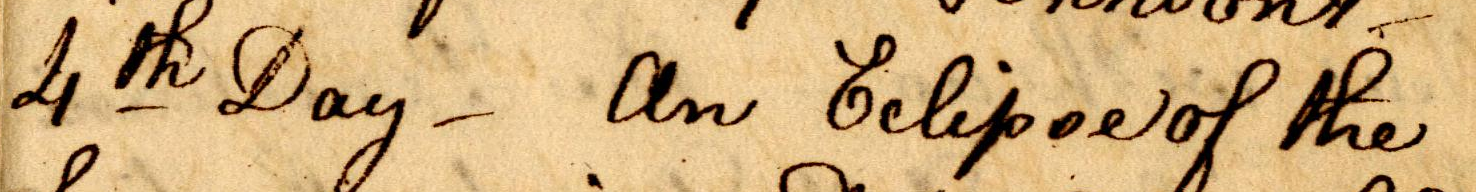4^th Day- An Eclipse of the
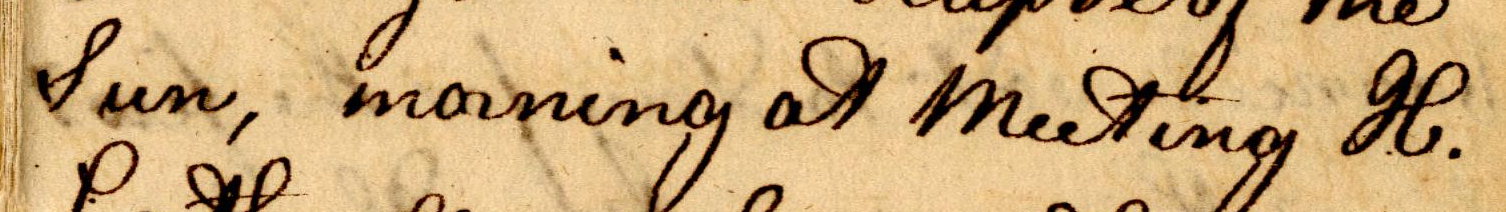Sun, morning at Meeting H.
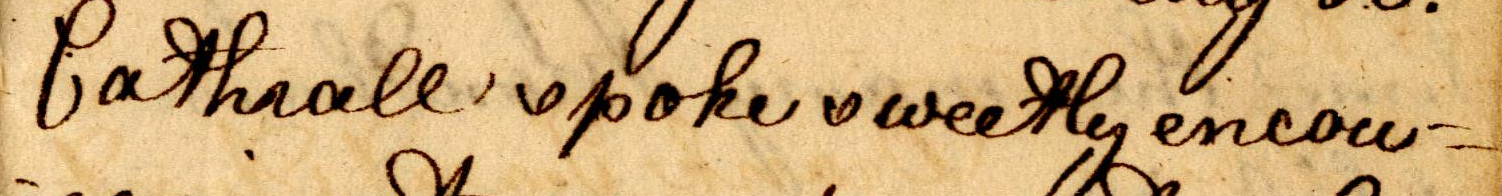Cathrall spoke sweetly encou-
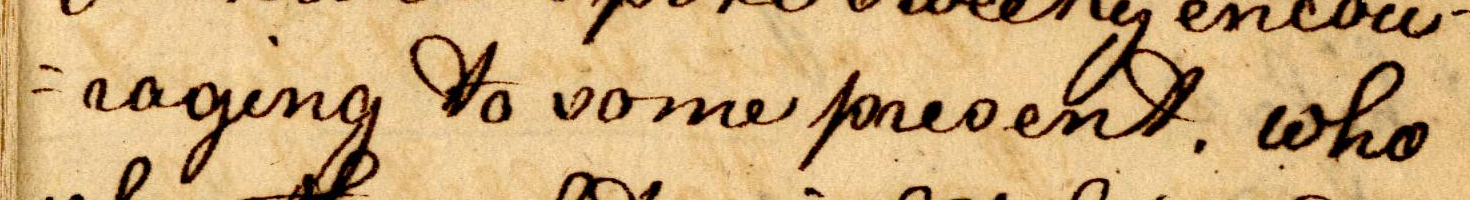-raging to some present. who
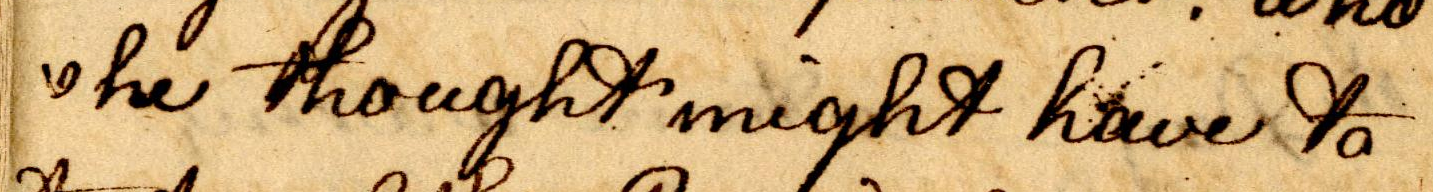she thought might have to
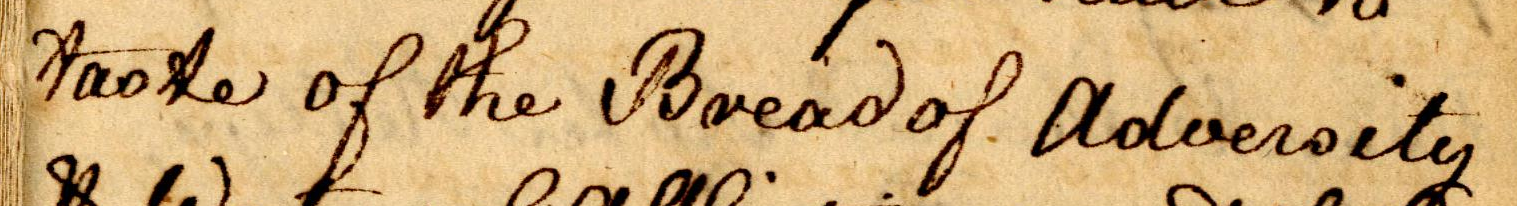taste of the Bread of Adversity
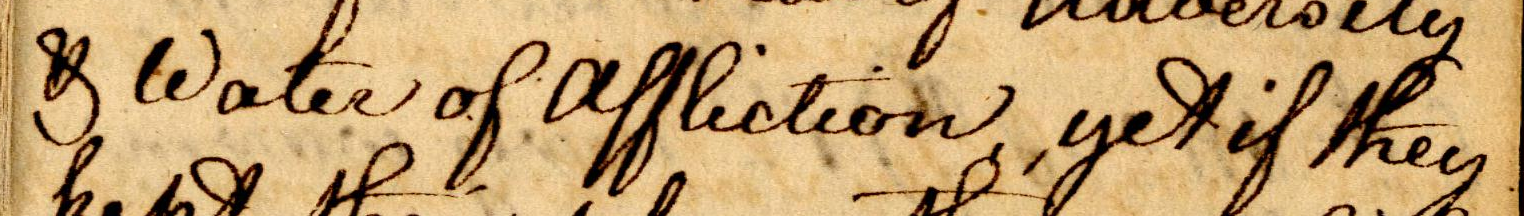& Water of Affliction, yet if they
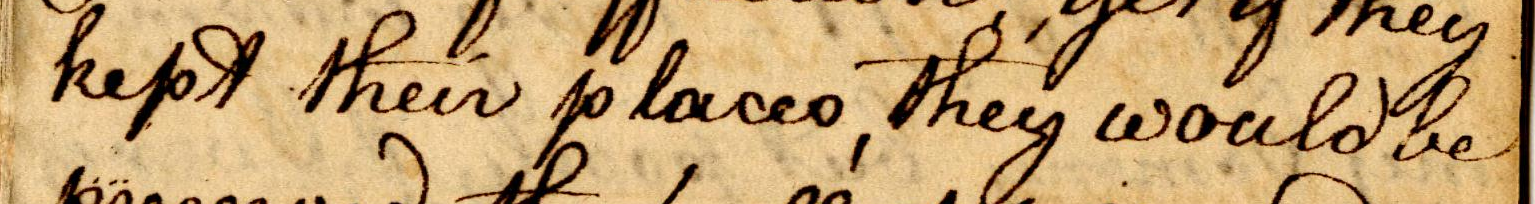kept their places, they would be
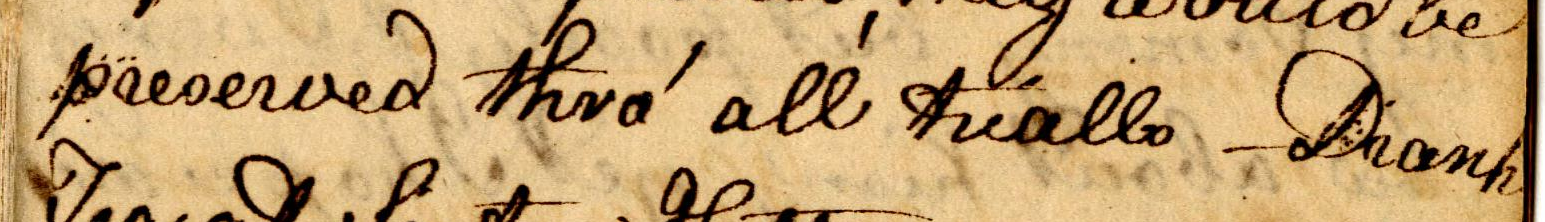preserved thro' all trialls,- Drank
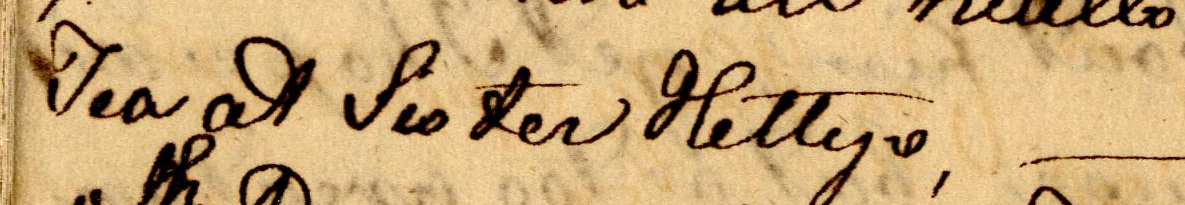Tea at Sister Hettys,-
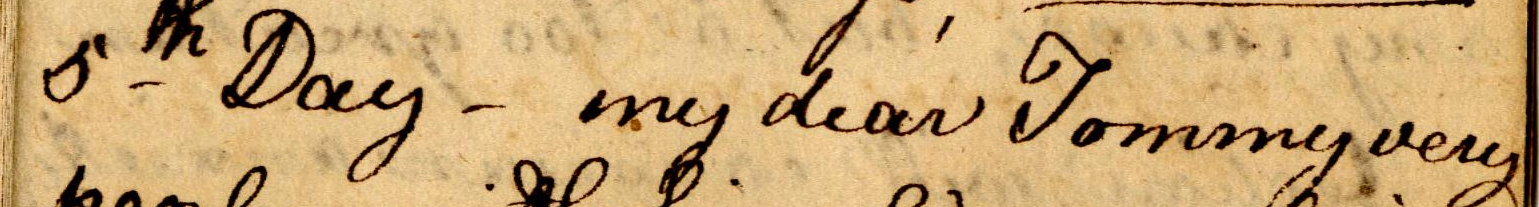5^th Day- my dear Tommy very
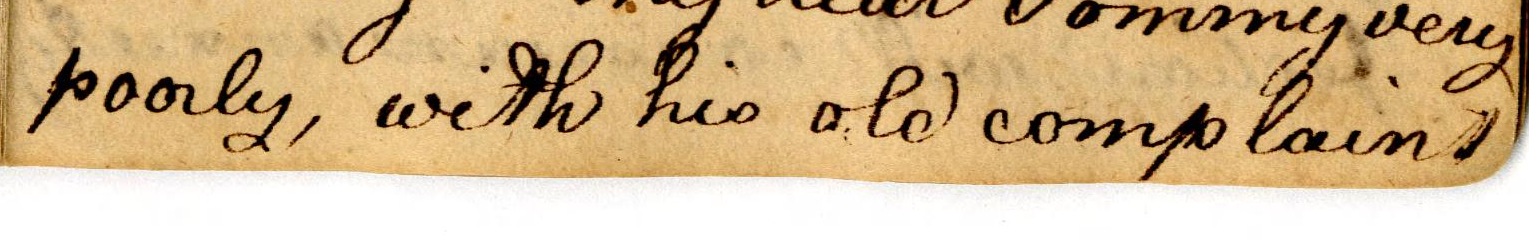poorly, with his old complaint
